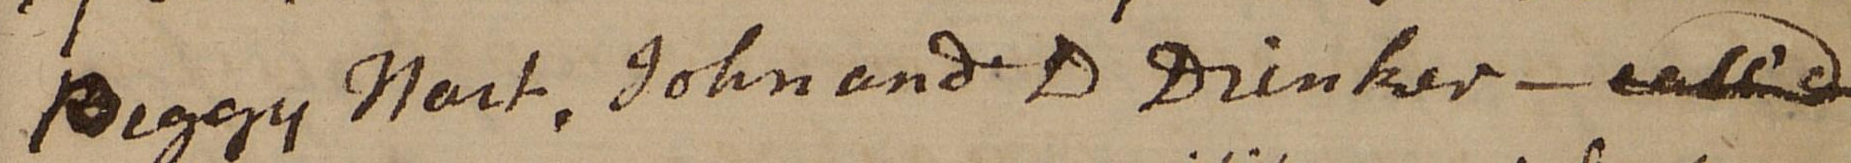Peggy Nart, John and D Drinker- [call'd]
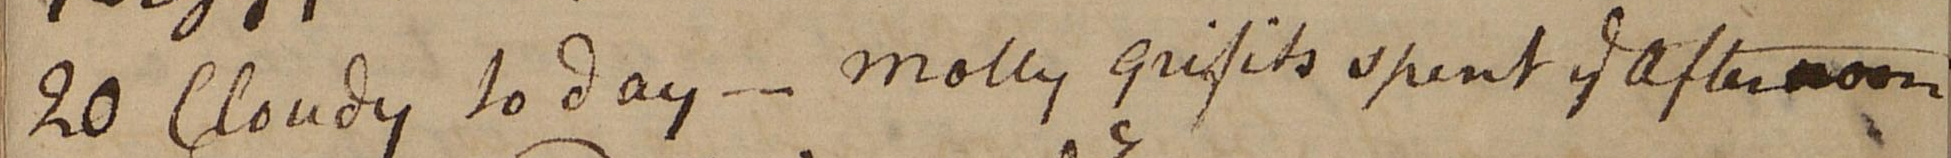20 Cloudy to day- Molly Grifits spent y^e afternoon
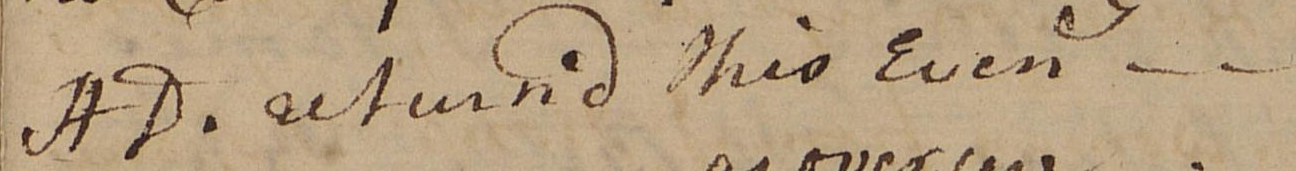HD. return'd this Even^g--
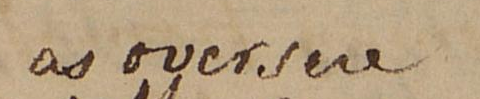as oversere
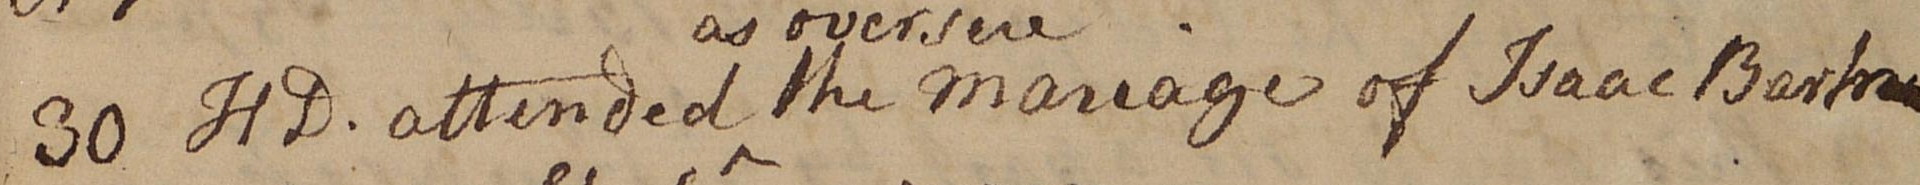30 HD. attended ^ the marriage of Isaac Bartram
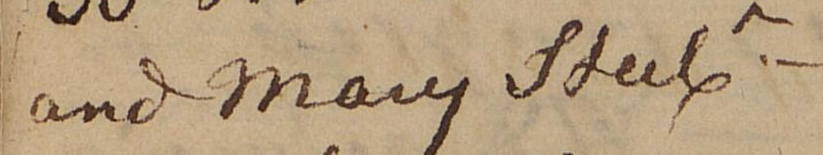and Mary Steel-
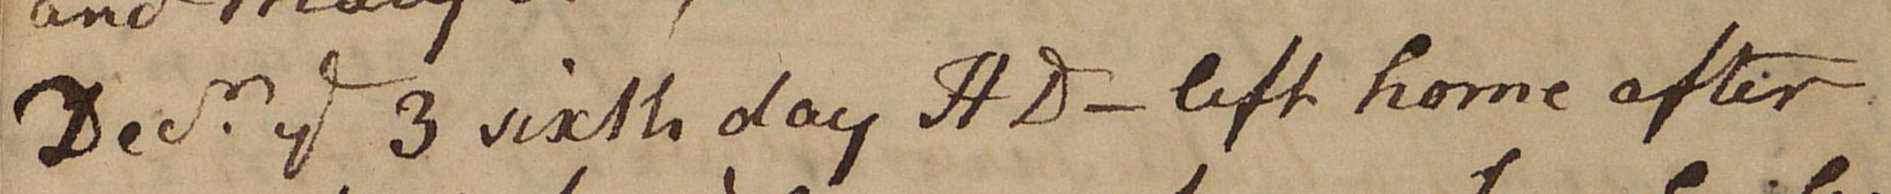Dec^r. y^e 3 sixth day HD- left home after
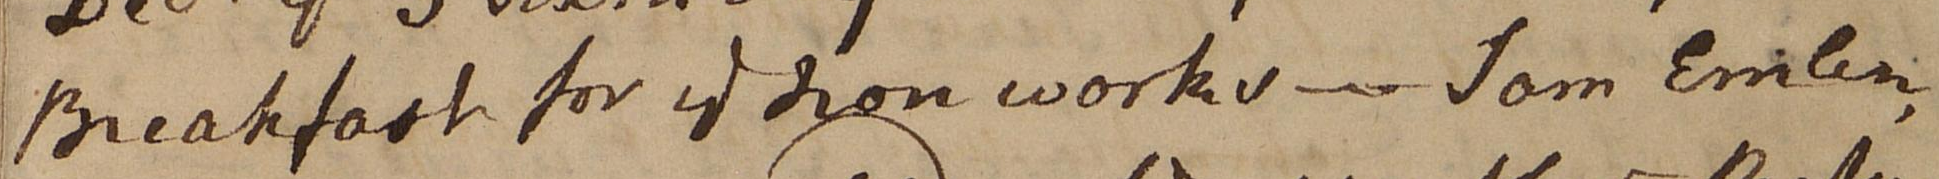Breakfast for y^e Iron works- Sam Emlen,
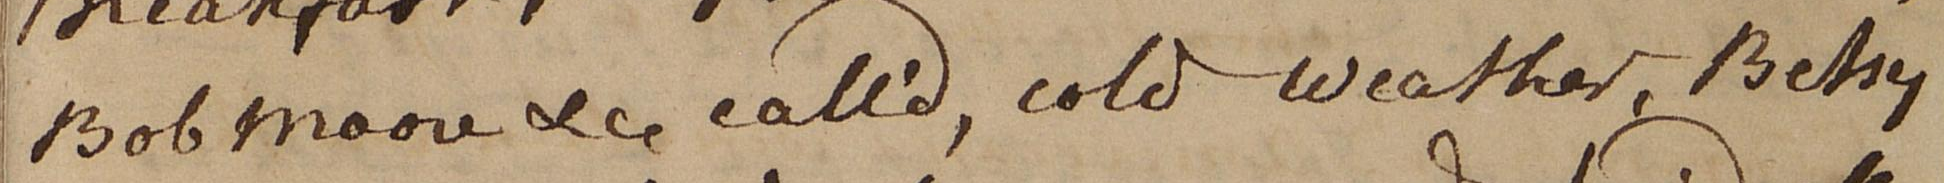Bob Moore &c call'd, cold weather, Betsy
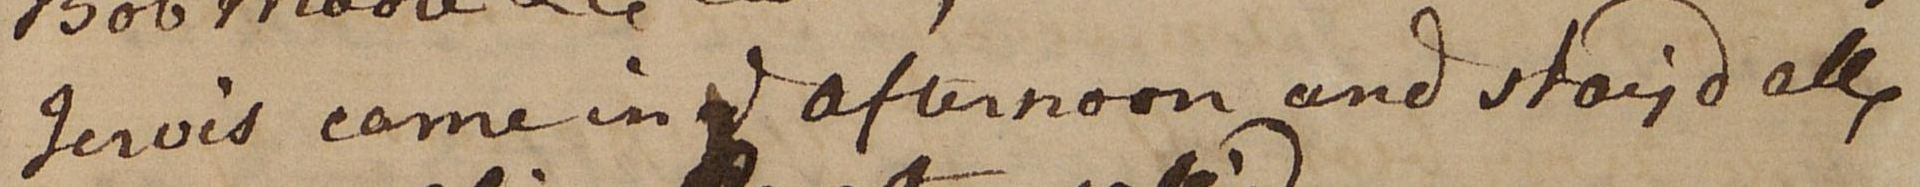Jevis came in y^e afternoon and stay'd all
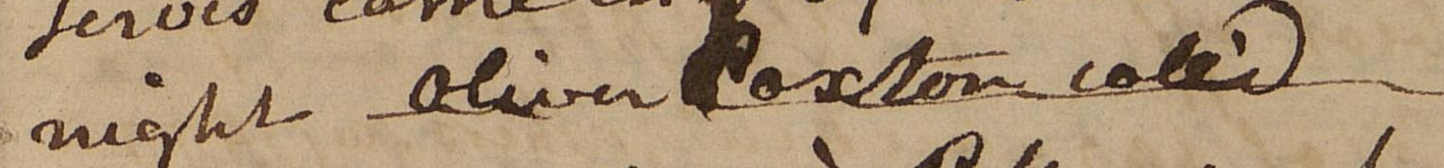night- Oliver [_]oxton call'd
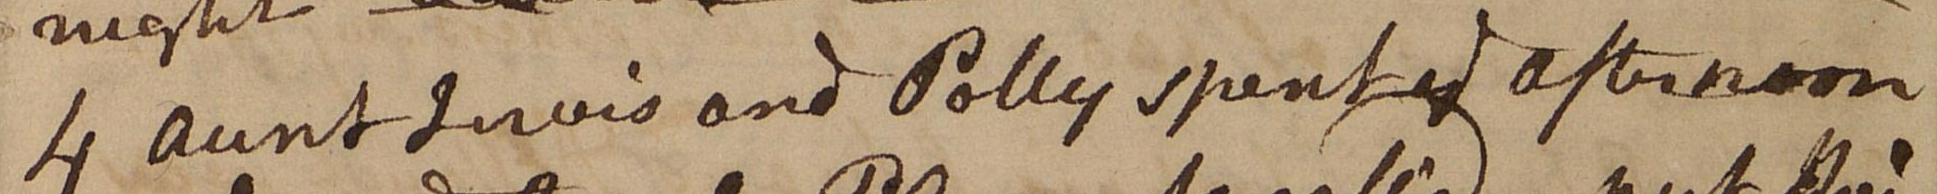4 Aunt Jervis and Polly spent y^e afternoon
